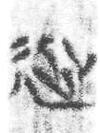○（過）
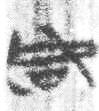如
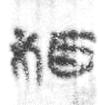相
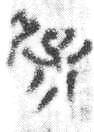保
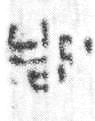如
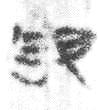母
